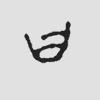曰
